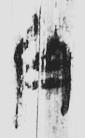於
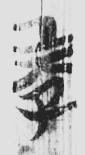孝（老）
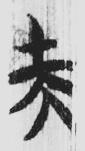夫
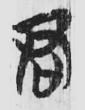君
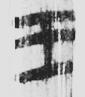王
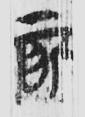所
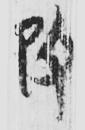改
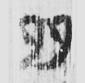多
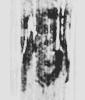君
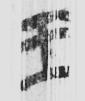王
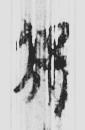保
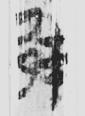邦
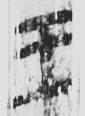王
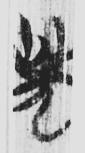{艸犬}（笑）
